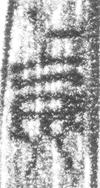鼎
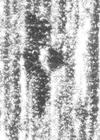十
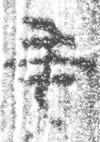屯
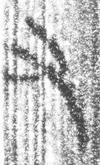又
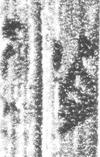{金此}
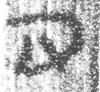四
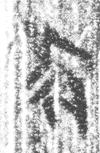索
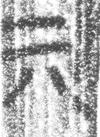亓（其）
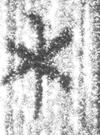木
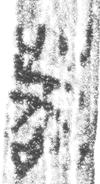器
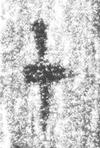十
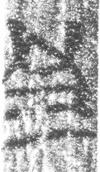皇
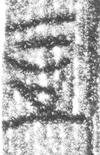豆
